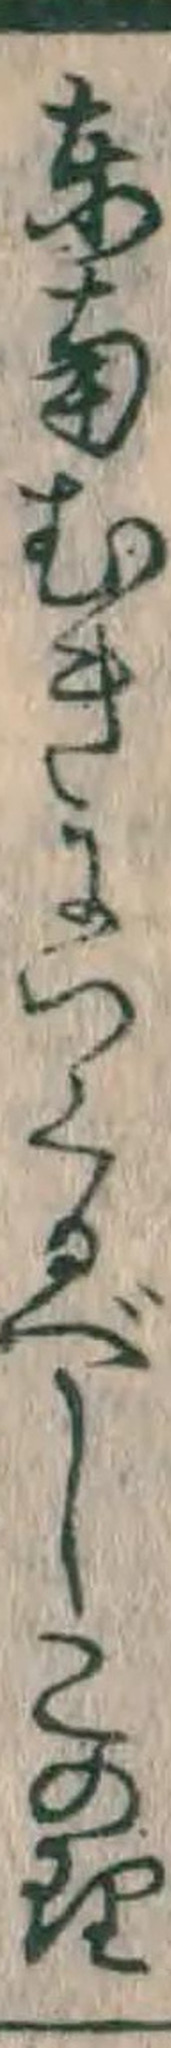東南むきにつくるべしこの理
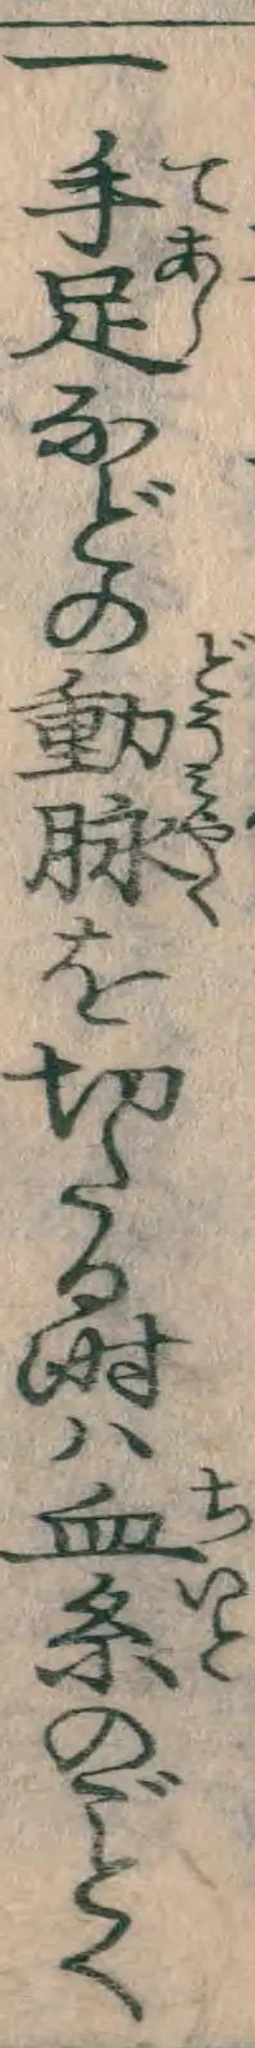一手足などの動脈を切たる時は血糸のごとく
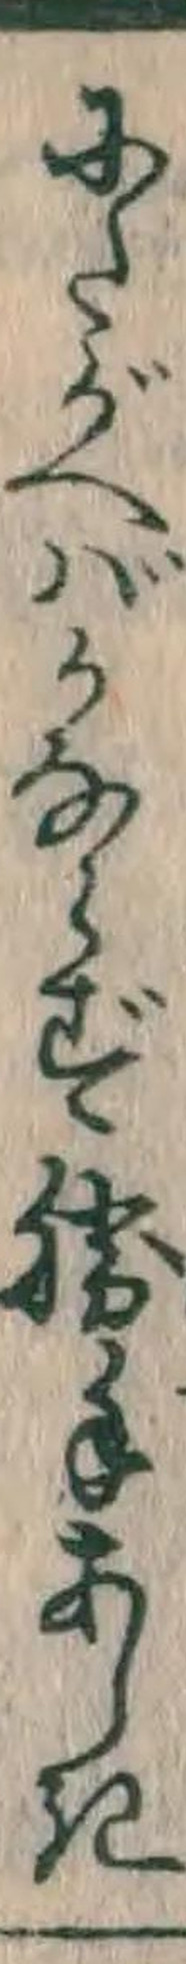にたがへばかならず勝手あしき
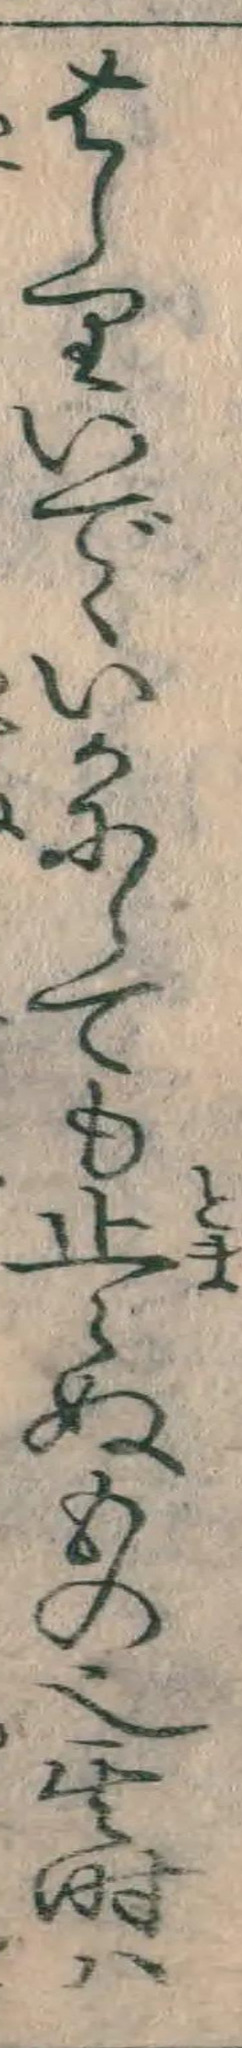はしりいでゝいかにしても止らぬもの也其時は
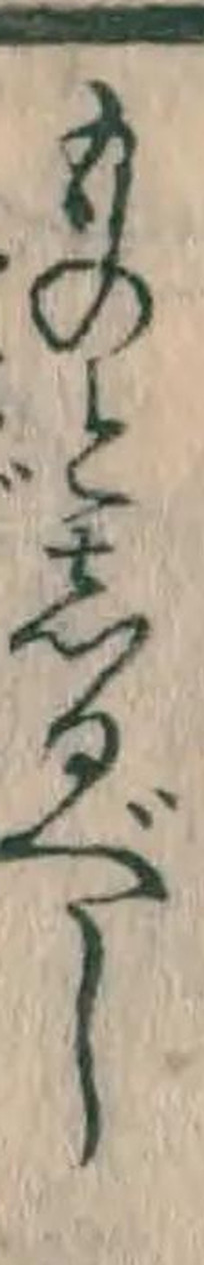ものとしるべし
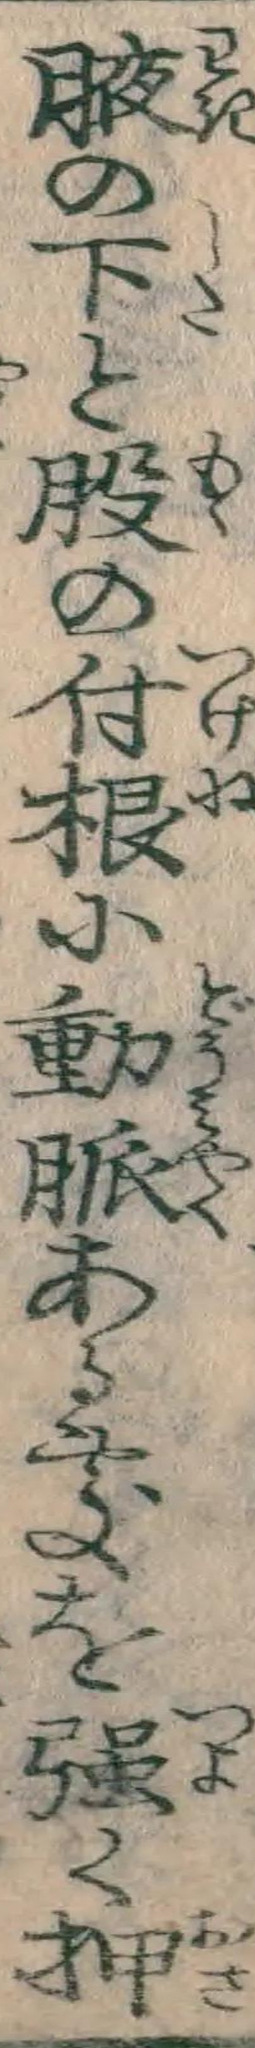腋の下と股の付根に動脈ある處を強く押
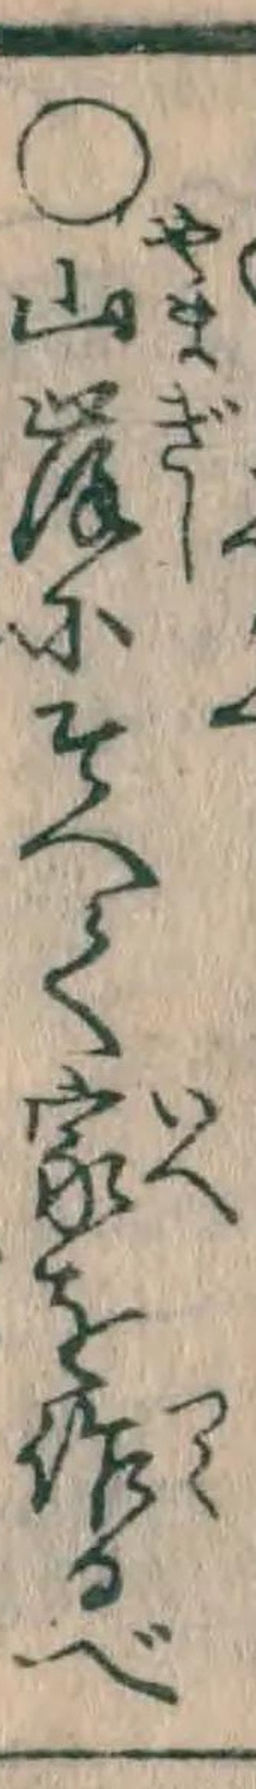○山岸にそへて家を作るべ
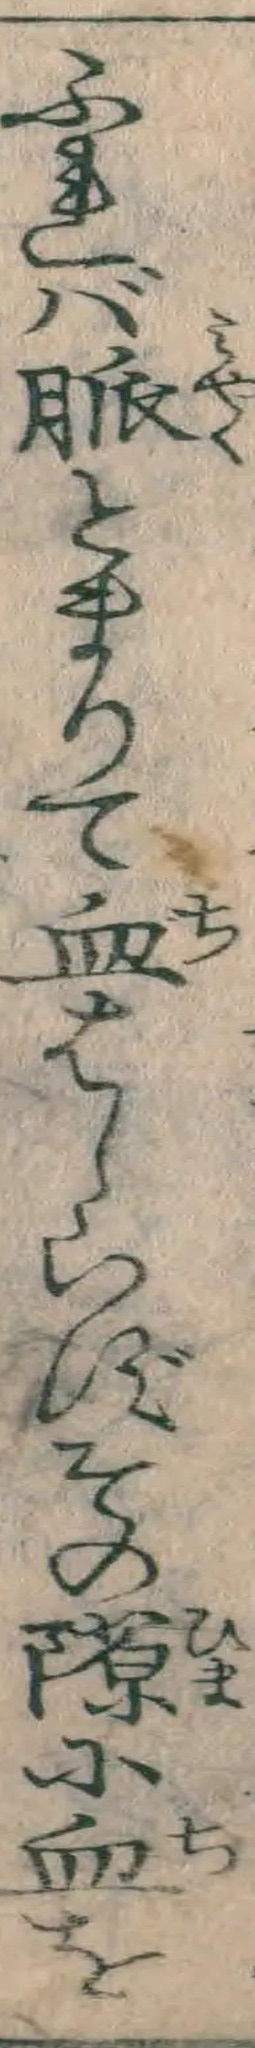ふれば脈とまりて血はしらずその隙に血を
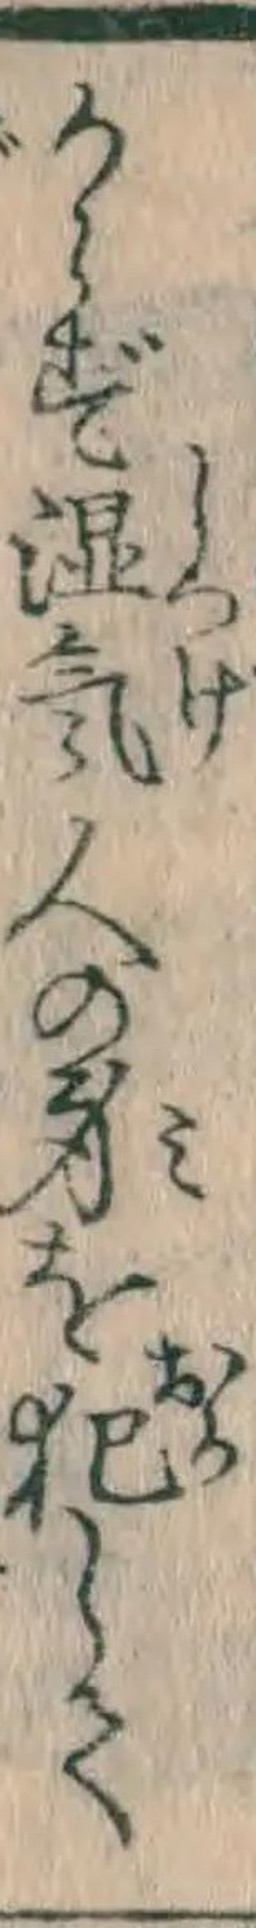からず湿気人の身を犯して
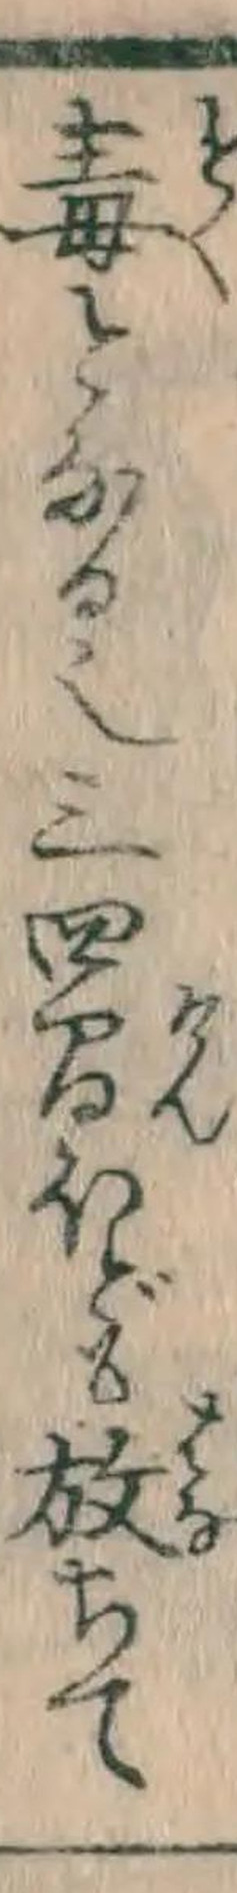毒となる也三四間ほども放ちて
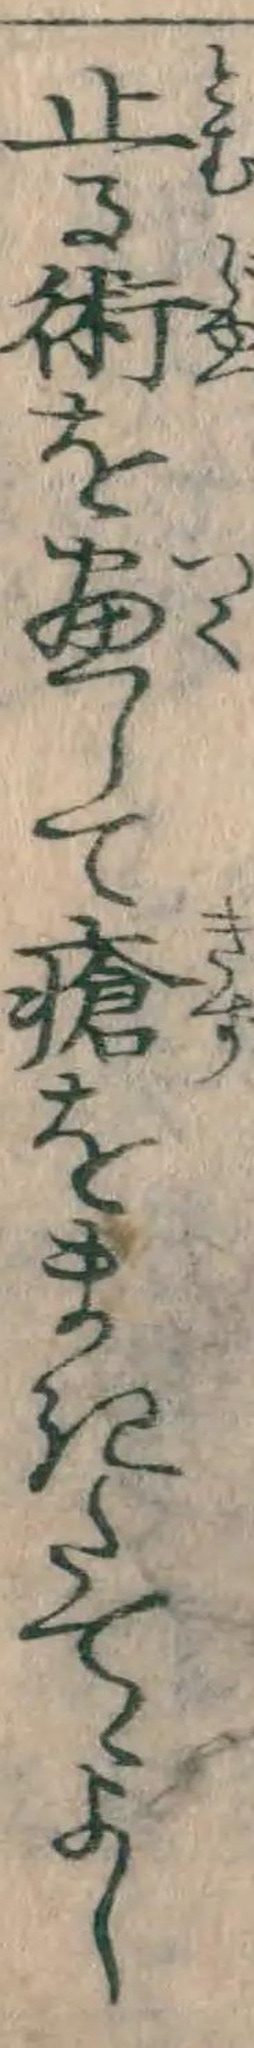止る術を尽して瘡をまきたてゝよし

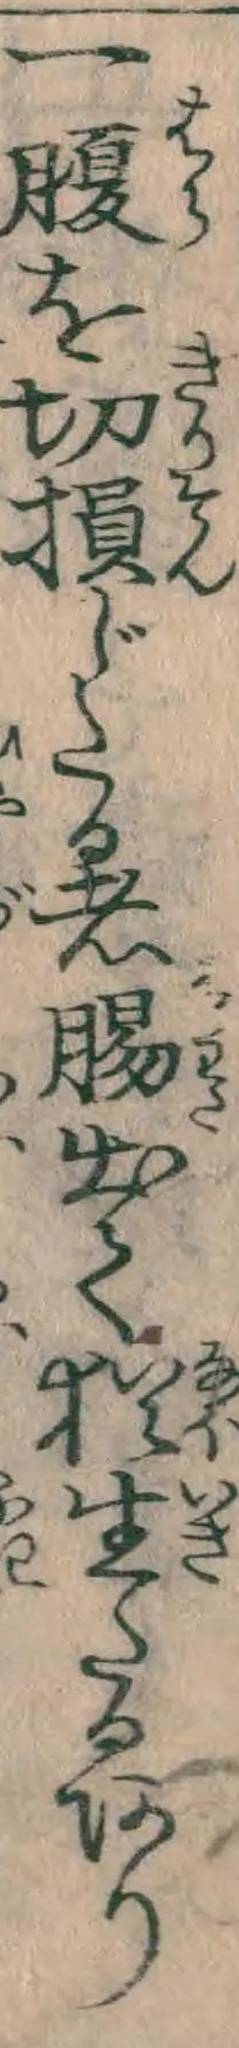一腹を切損じたる者腸出て猶生たるあり
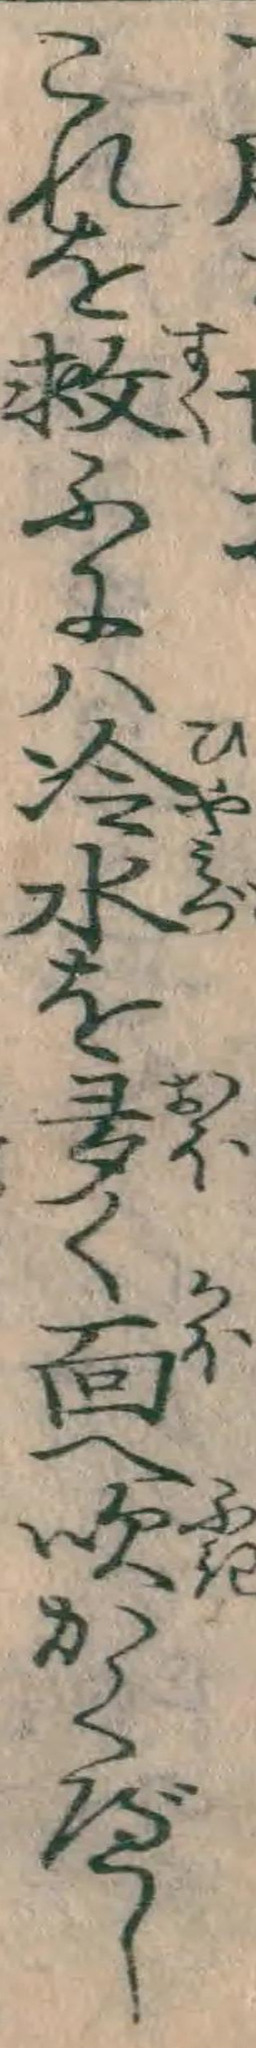これを救ふには冷水を多く面へ吹かくべし
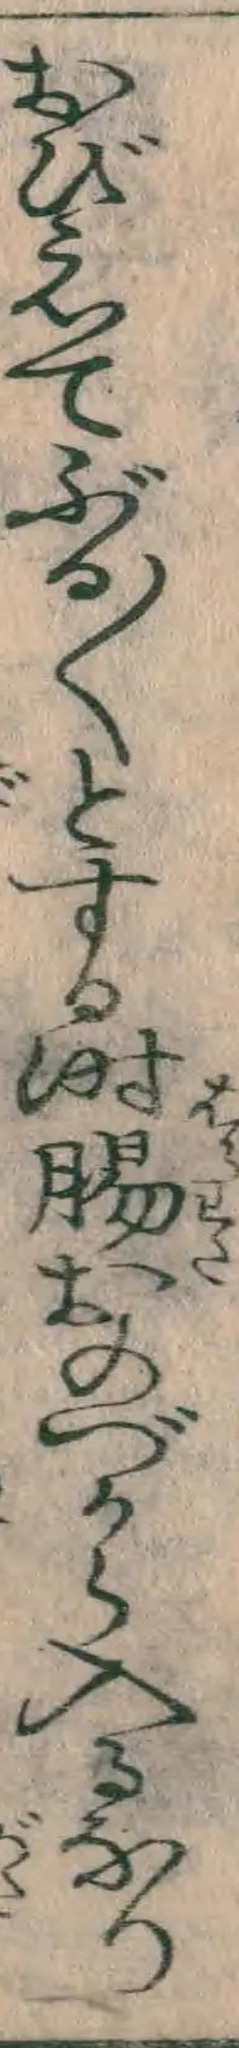おびえてぶる〳〵とする時腸おのづから入るなり
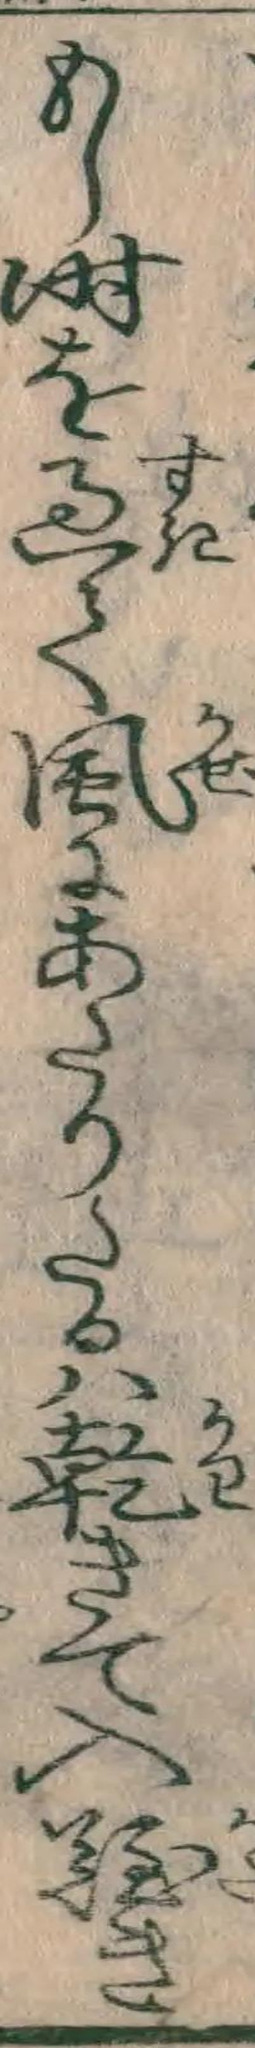もし時を過て風にあたりたるは乾きて入難き
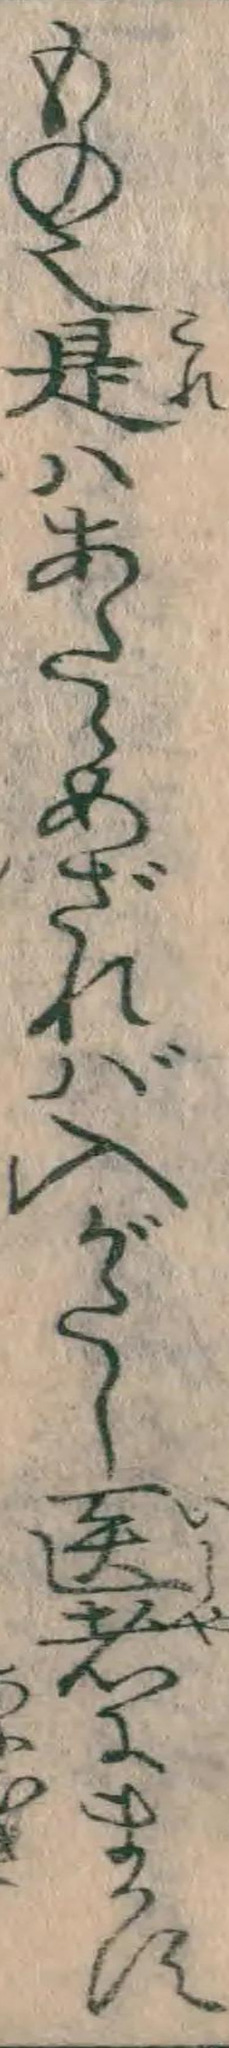もの也是はあたゝめざれば入がたし医者にまかす
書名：広益秘事大全 3巻. [3]
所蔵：国立国会図書館 National Diet Library, JAPAN
